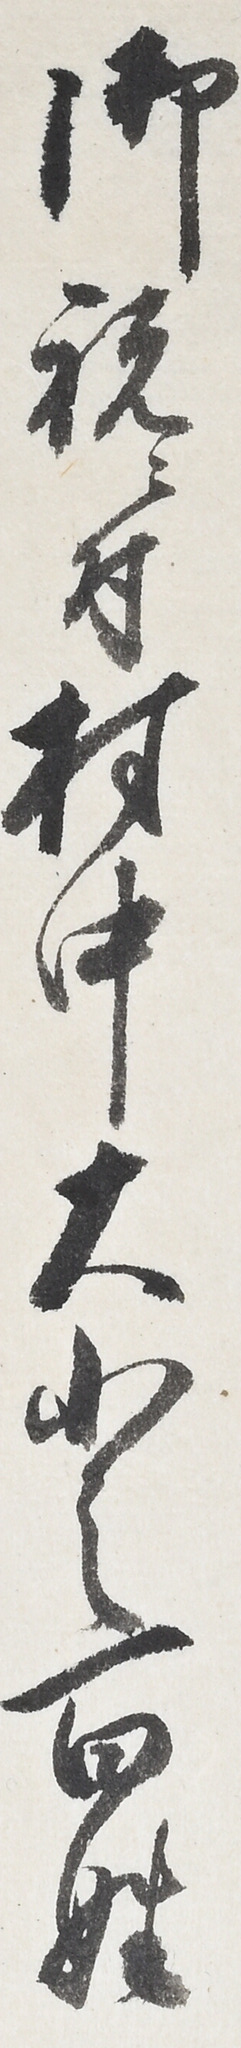御祝ニ付村中大小之百姓
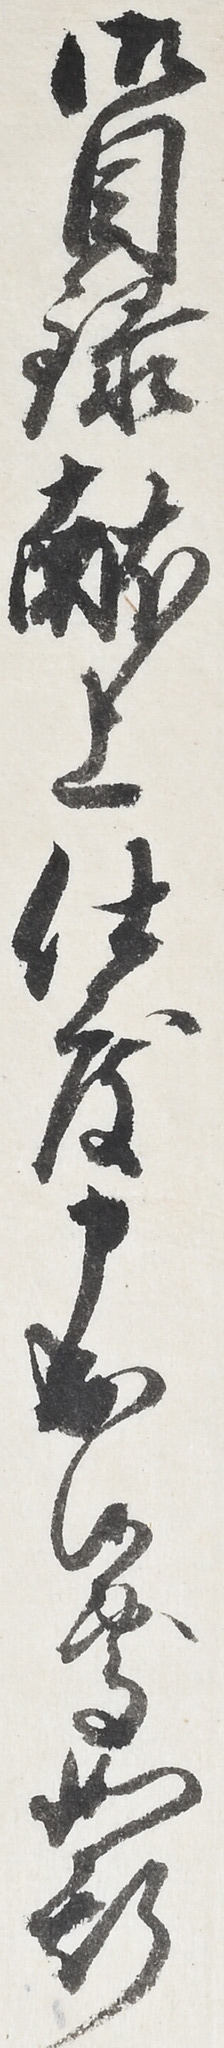御目録献上仕度申出候処如斯
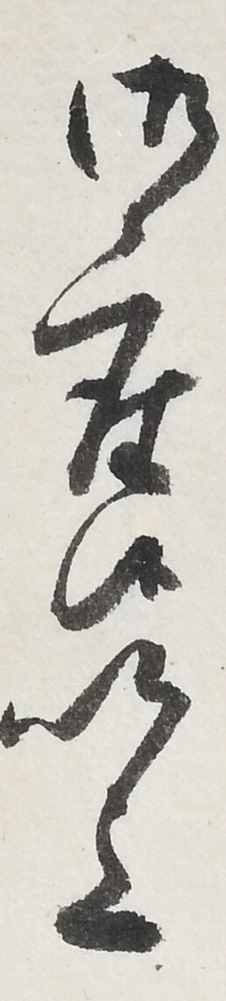御座候以上
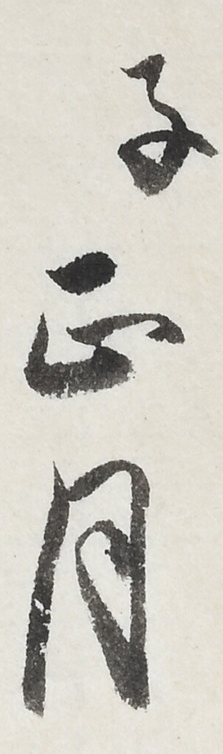子正月

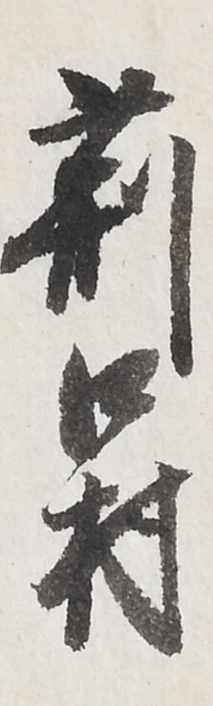荊口村
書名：御拝地百五拾年御祝儀献上御目録名前
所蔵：伊那市立高遠町図書館・合同会社AMANE
